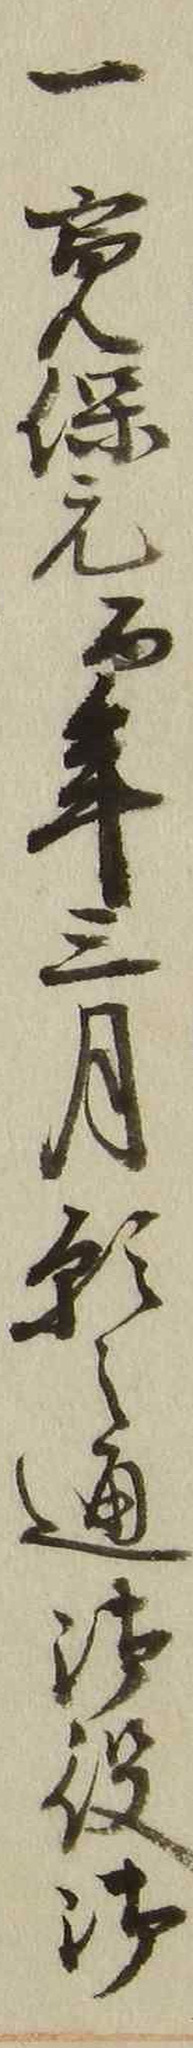一寛保元酉年三月願之通御役御
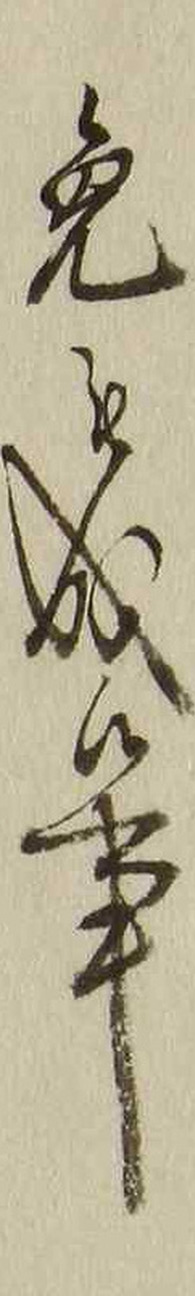免被成候事
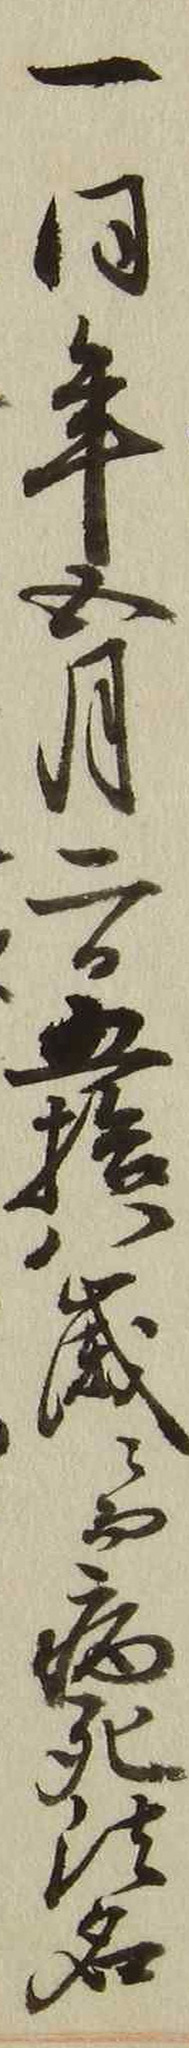一同年五月二日五拾八歳ニ而病死法名
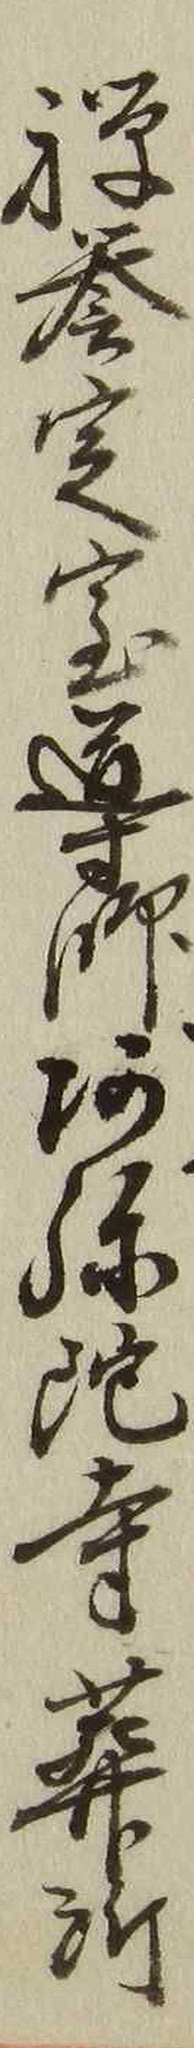禅誉定宝導師阿弥陀寺葬所
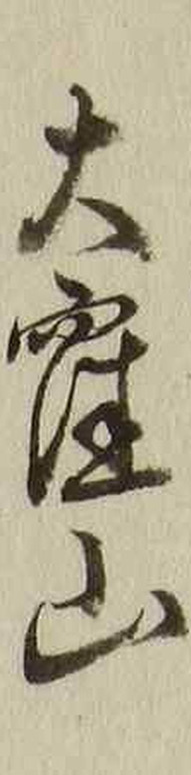大窪山
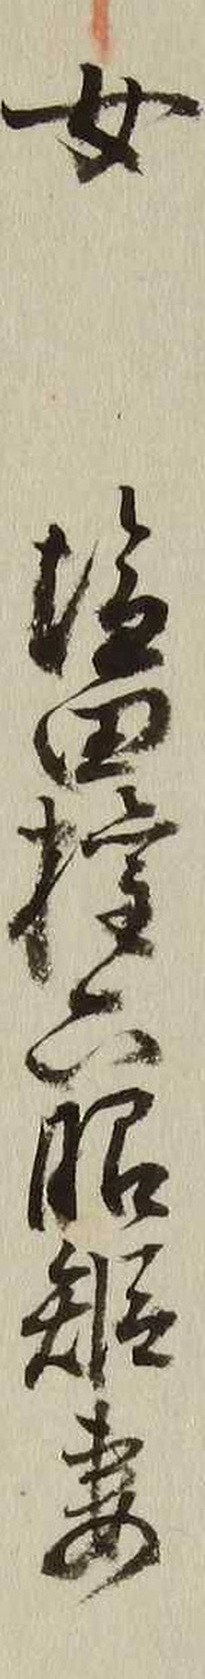女塩田権六昭矩妻
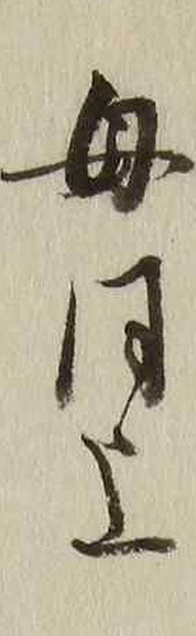母同上
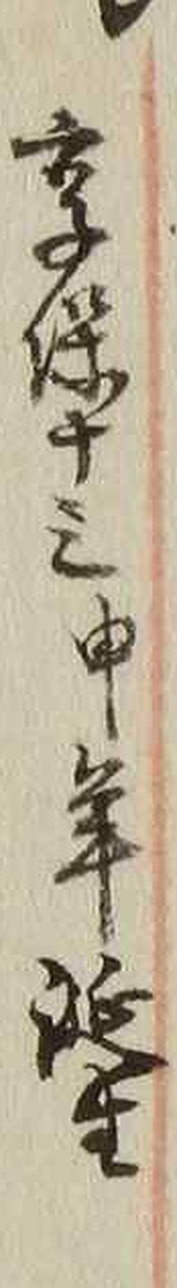享保十三申年誕生
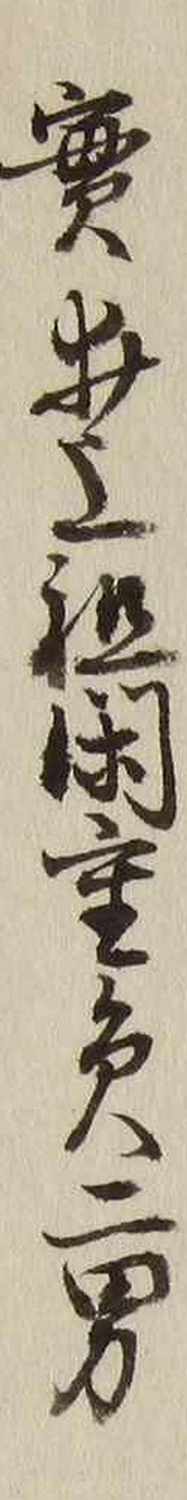実井上祖閑重員二男
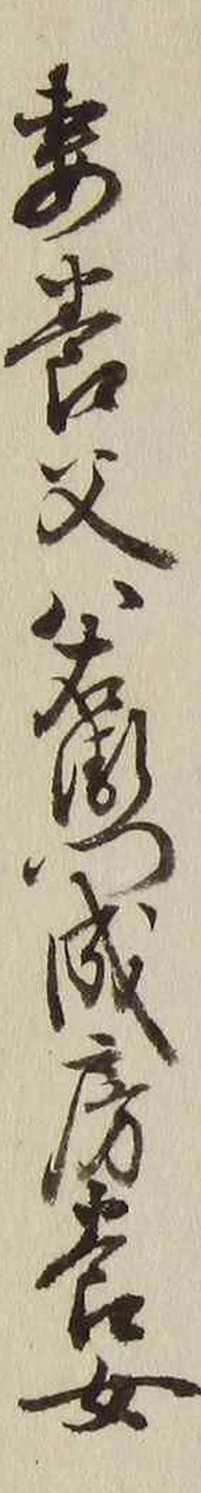妻養父八右衛門成房養女
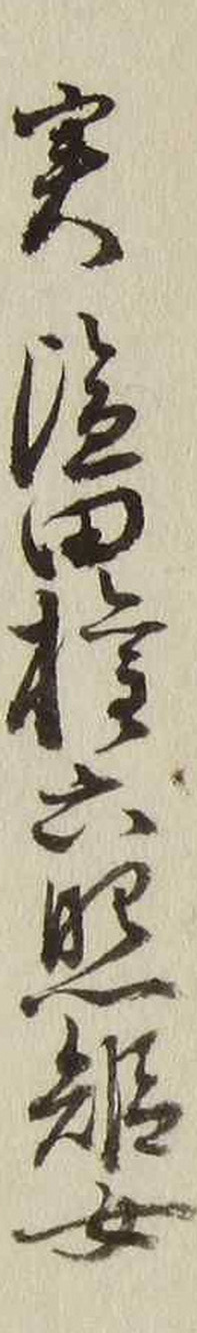実塩田権六照矩女
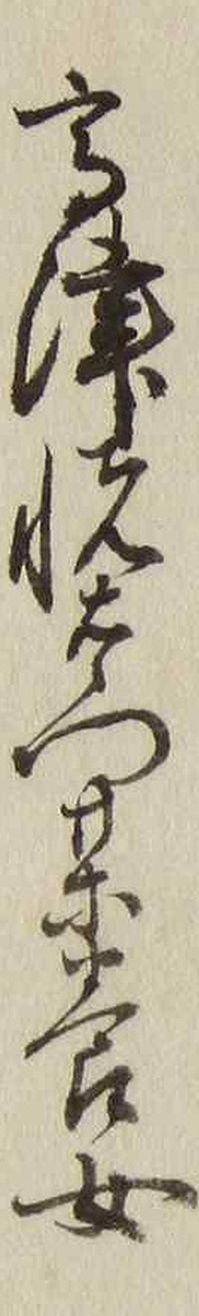高津悦右衛門某養女

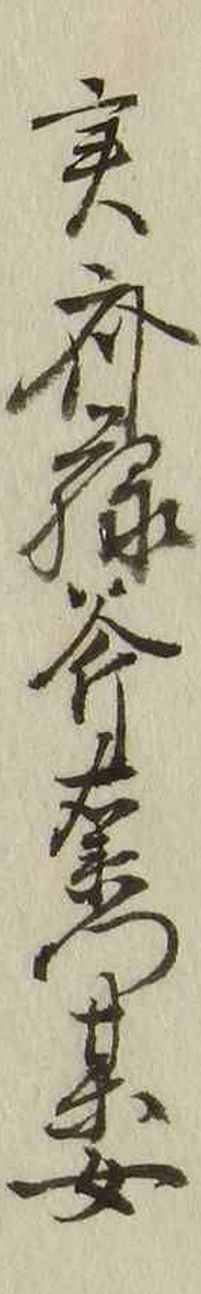実斉藤斧右衛門某女
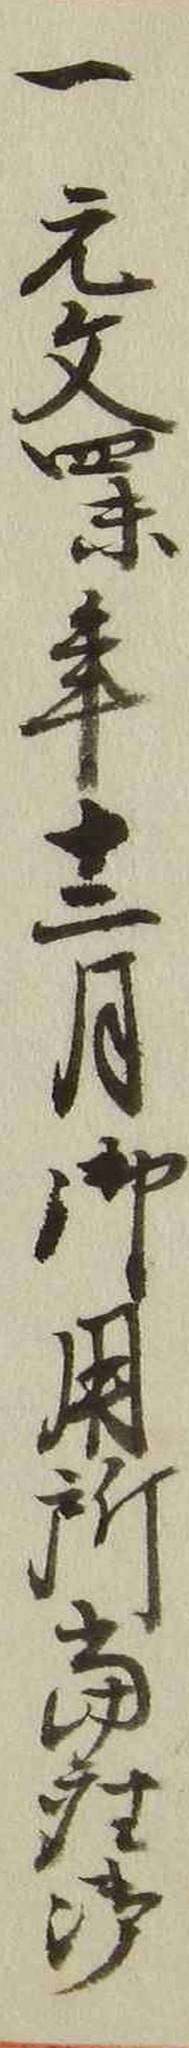一元文四未年十二月御用所当座御
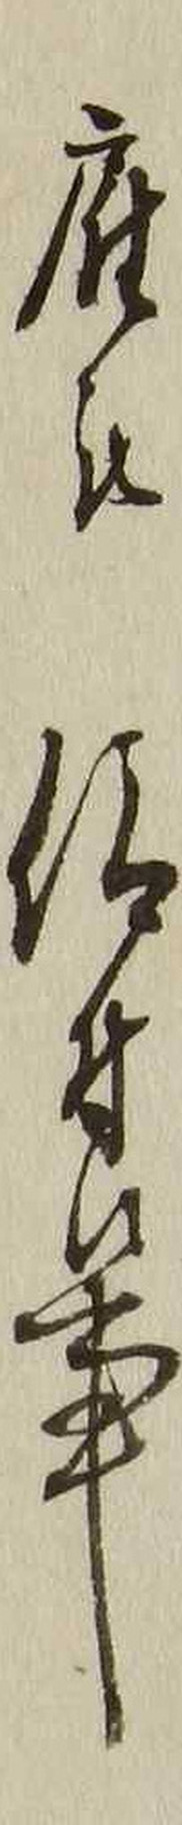雇被仰付候事
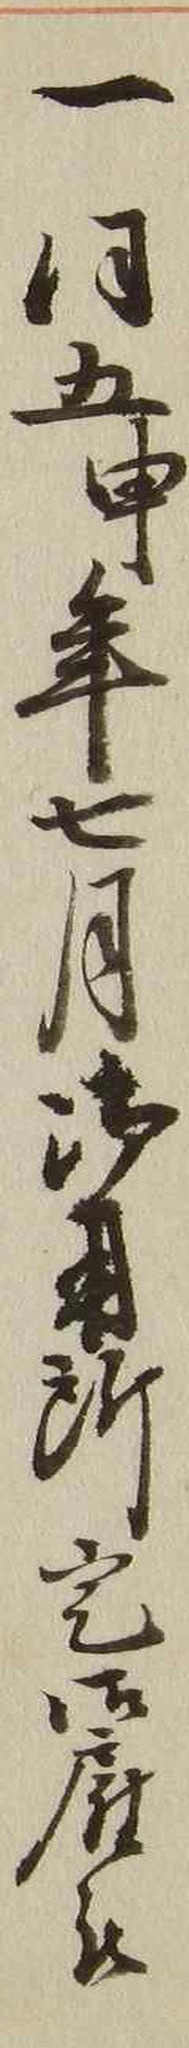一同五申年七月御用所定御雇被
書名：諸士系譜　巻之27　い之部27
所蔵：会津若松市立会津図書館
